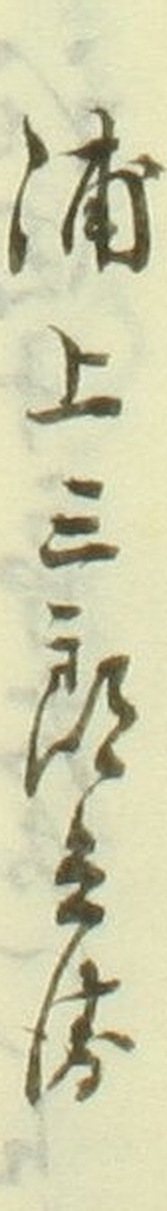浦上三郎兵衛
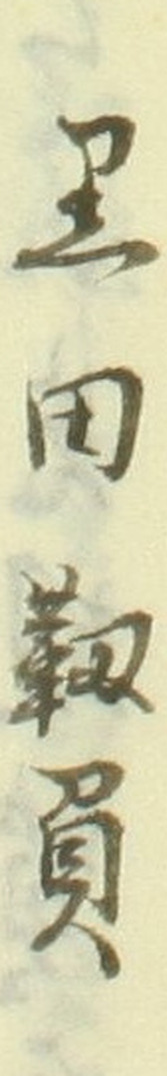黒田靭負
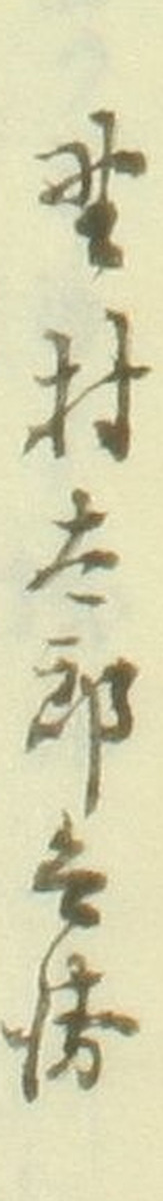野村太郎兵衛
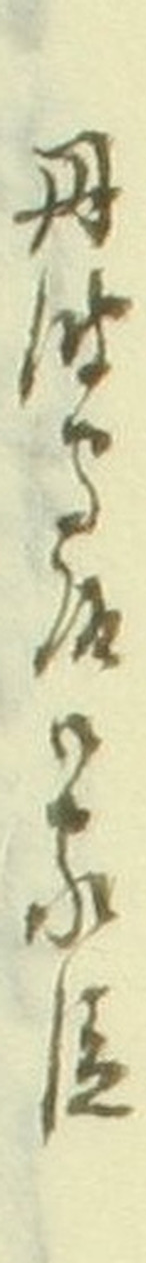丹波守殿御家臣
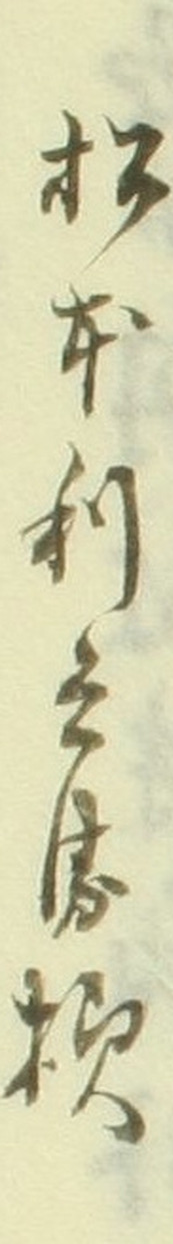松平利兵衛様
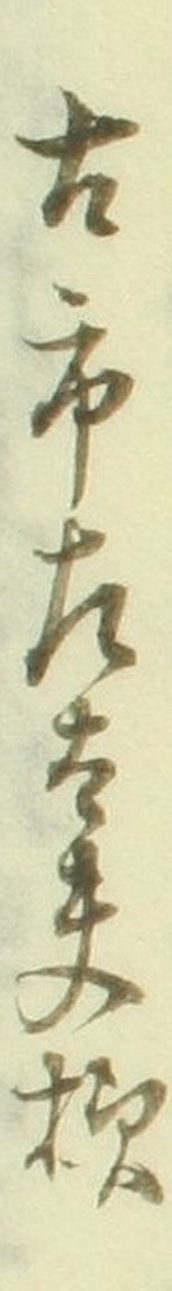古市左太夫様
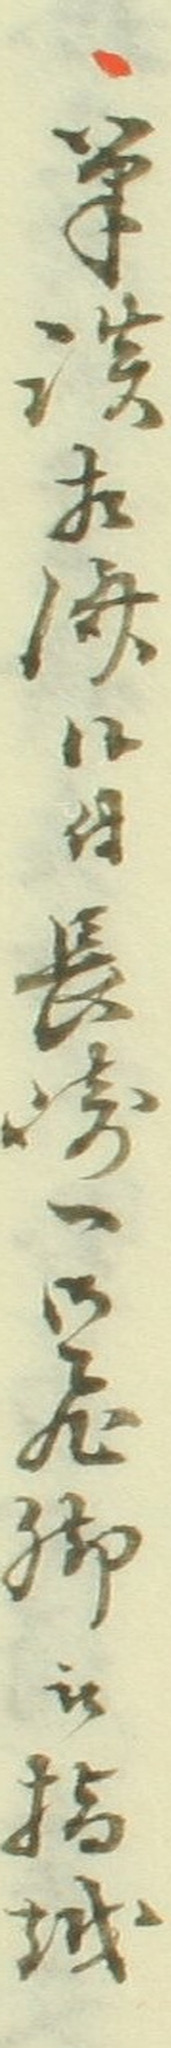筆談相済候付長崎へ御飛脚被指越
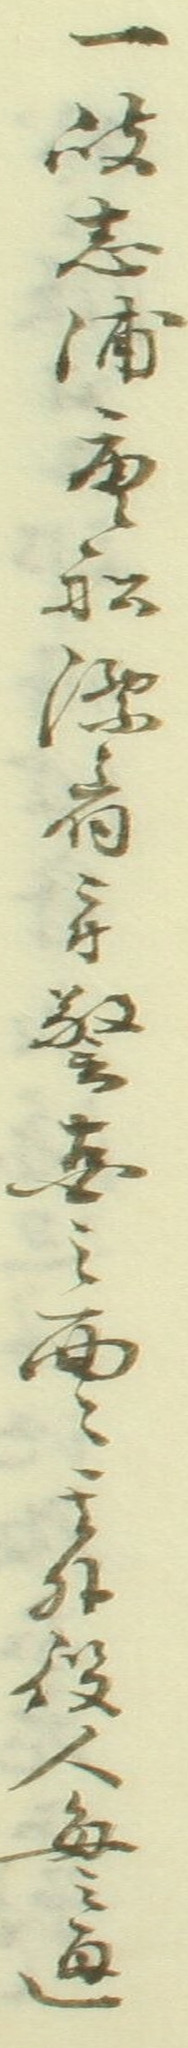一岐志浦唐船漂着に付警固之面々其外役人毎之通
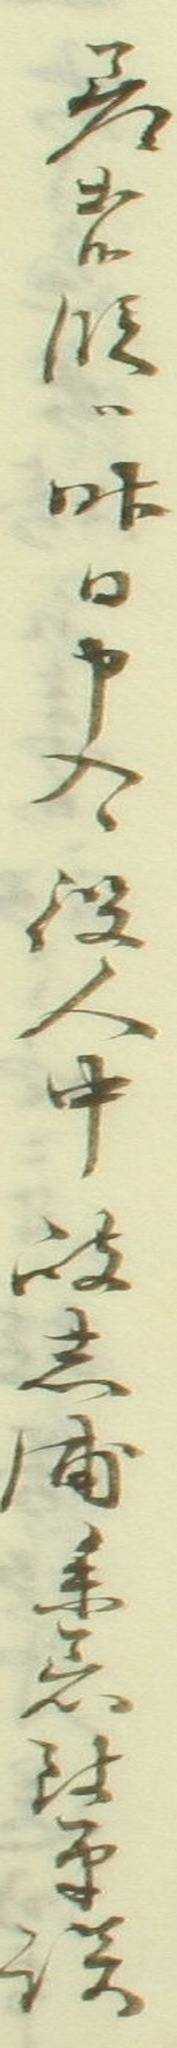指出候段は昨日申入候役人中岐志浦参着致筆談
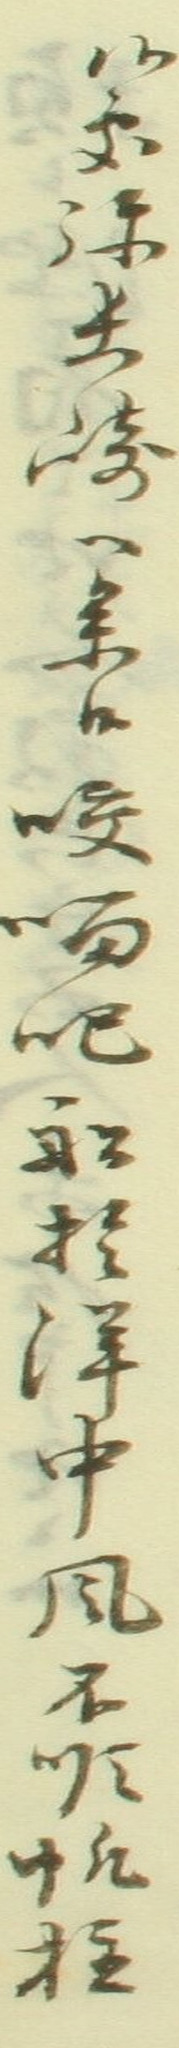候処弥長崎へ参候咬𠺕吧船於洋中風不順帆柱

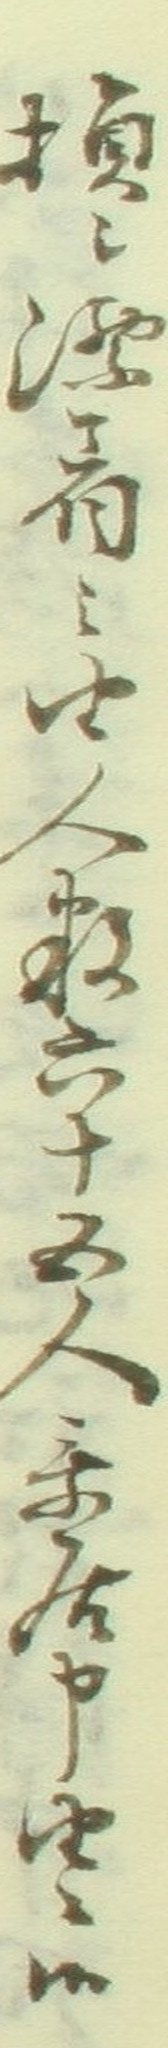損し漂着之由人数六十五人乗居申由に候
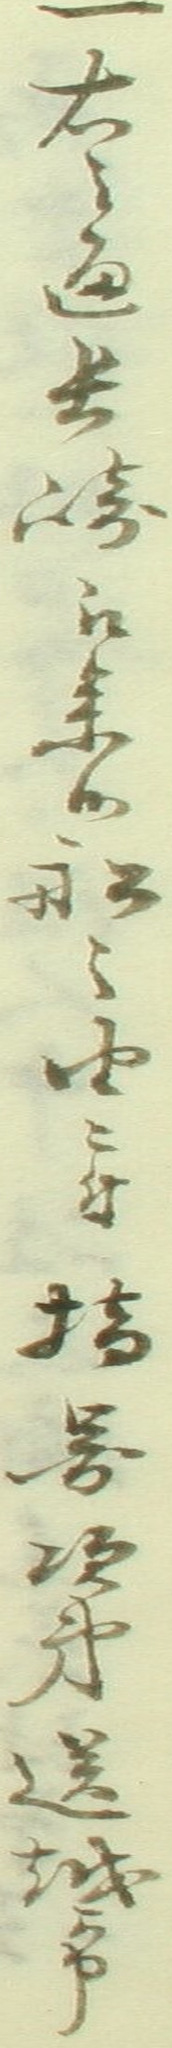一右之通長崎へ参候船之由に付指図次第送越可申
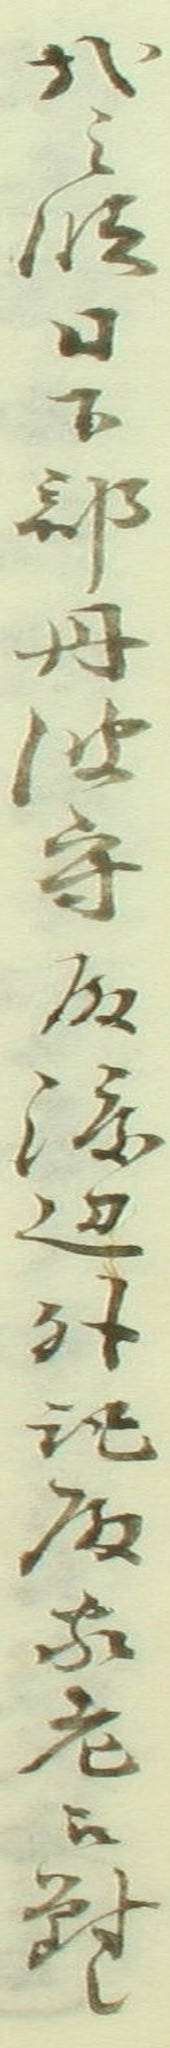哉之段日下部丹波守殿渡辺外記殿家老え対し
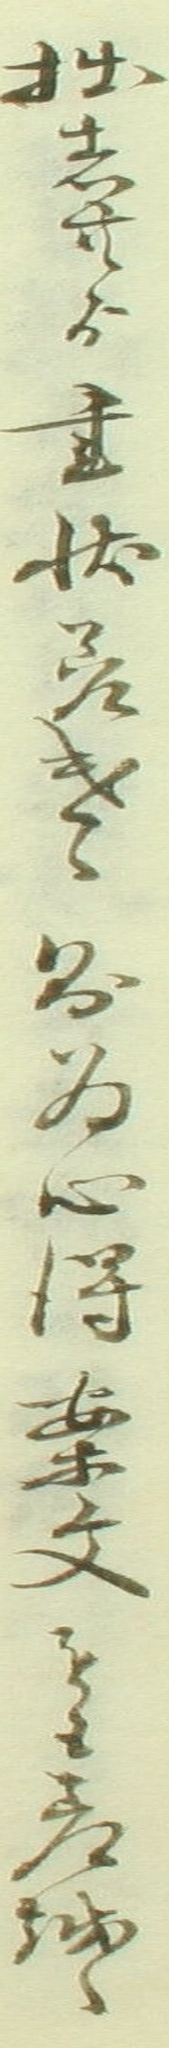拙者共ゟ書状差遣候則為心得案文をも差越候
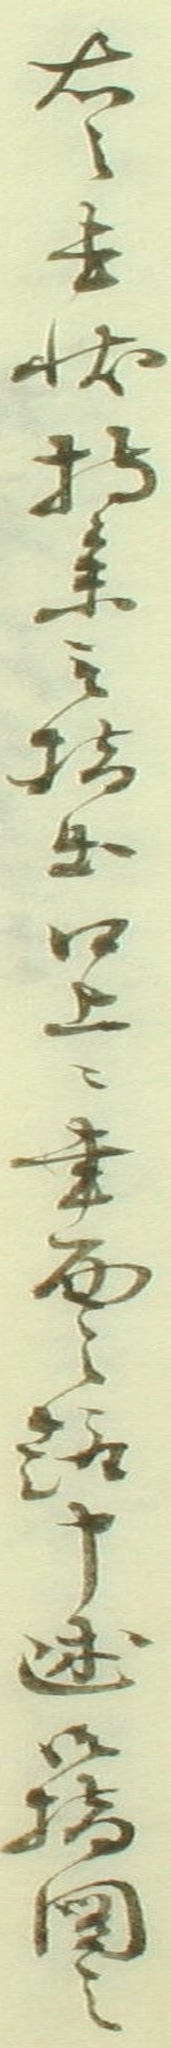右之書状持参被指出口上に書面之趣申述御指図之
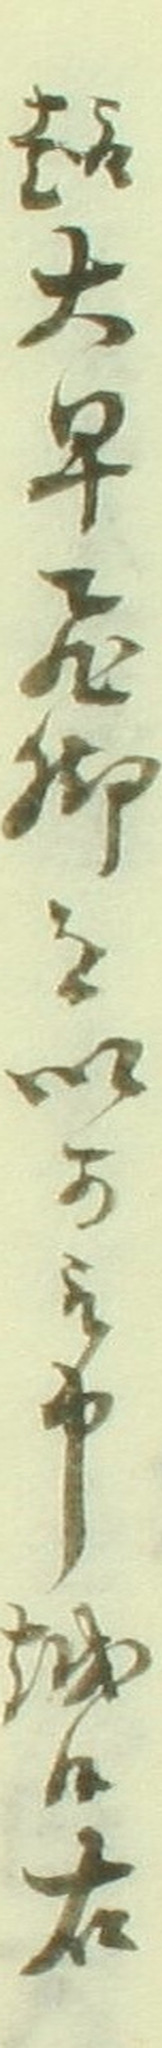趣大早飛脚を以可被申越候右
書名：異国船漂着記
